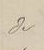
le
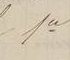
1er
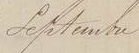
Septembre
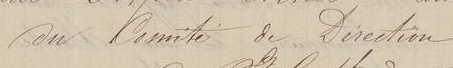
du Comité de Direction
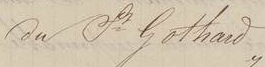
du St Gothard
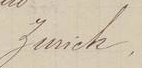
Zurich.
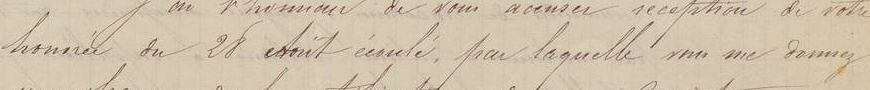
honorée du 28 Août écoulé, par laquelle vous me donnez
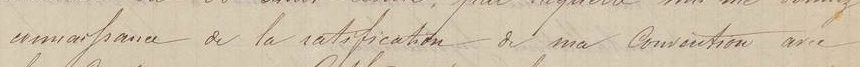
connaissance de la ratification de ma Convention avec
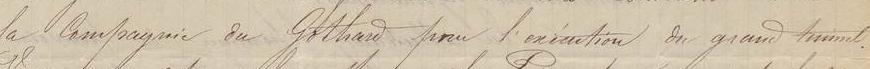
la Compagnie du Gothard pour l'exécution du grand tunnel.
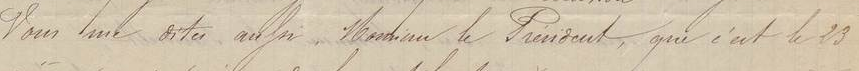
Vous me dites aussi, Monsieur le Président, que c'est le 23
